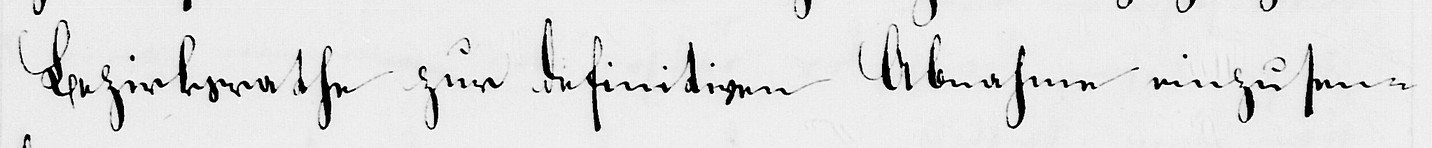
Bezirksrathe zur definitiven Abnahme einzusen¬
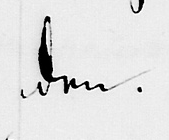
den.
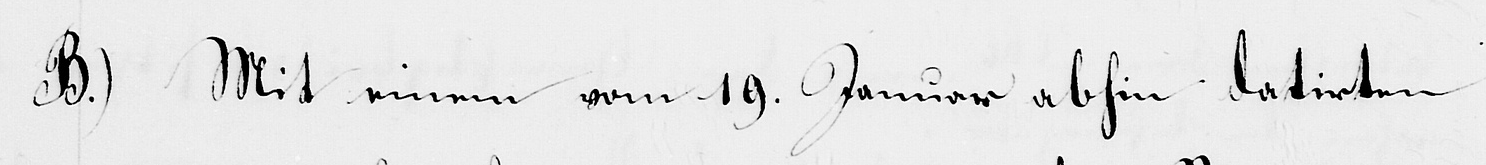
B.) Mit einem vom 19. Januar abhin datirten
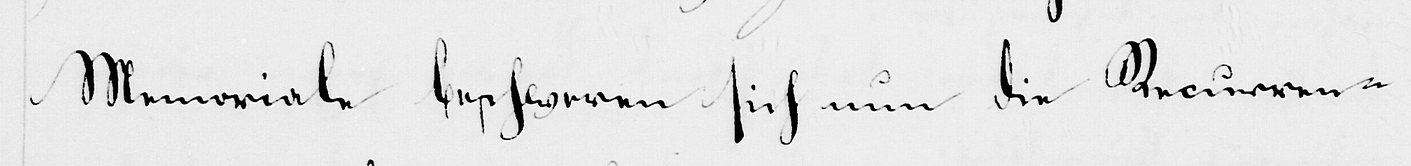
Memoriale beschweren sich nun die Recurren¬
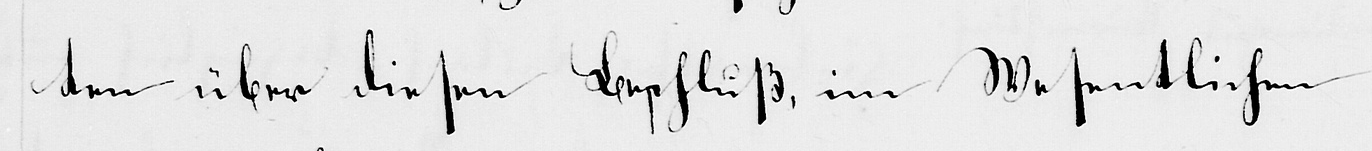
ten über diesen Beschluß, im Wesentlichen
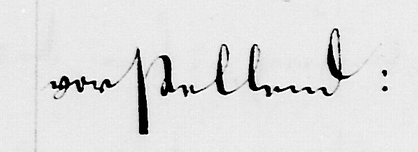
vorstellend:
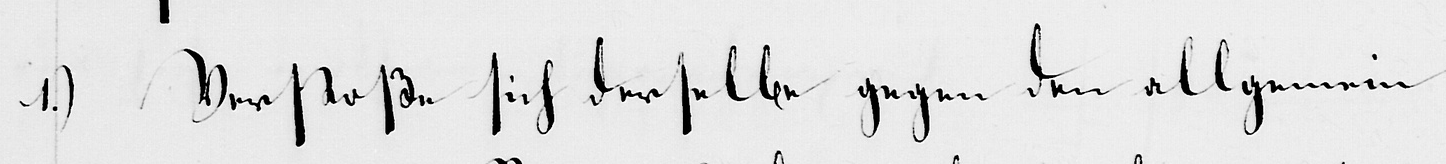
1.) Verstoße sich derselbe gegen den allgemein
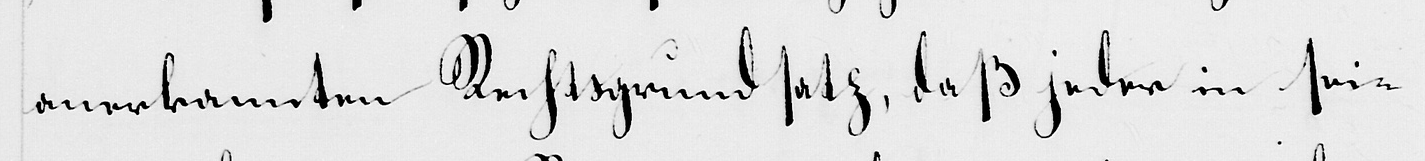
anerkannten Rechtsgrundsatz, daß jeder in sei¬
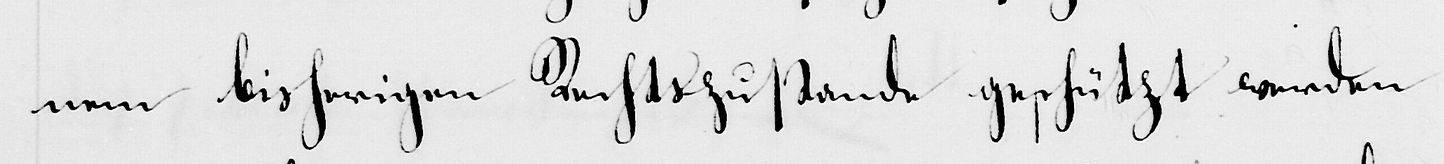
nem bisherigen Rechtszustande geschützt werden
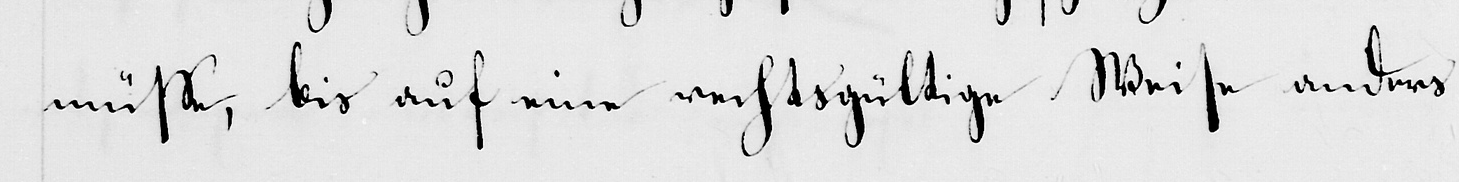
müße, bis auf eine rechtsgültige Weise anders
